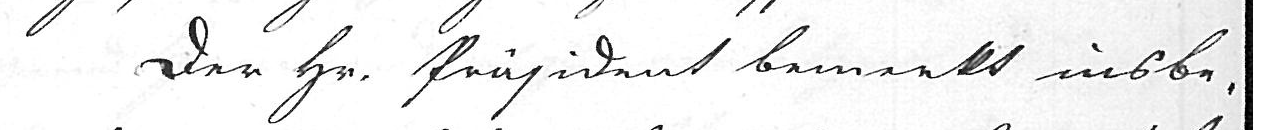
Der Hr. Präsident bemerkt insbe-
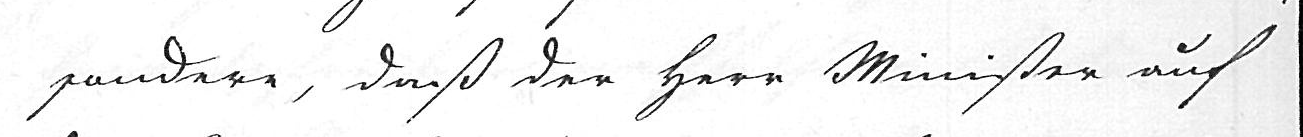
sondere, daß der Herr Minister auf
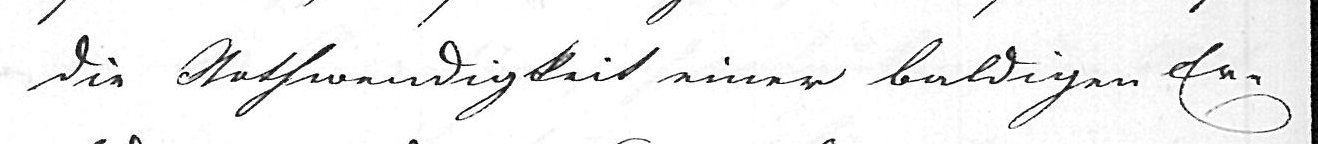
die Nothwendigkeit einer baldigen Er-
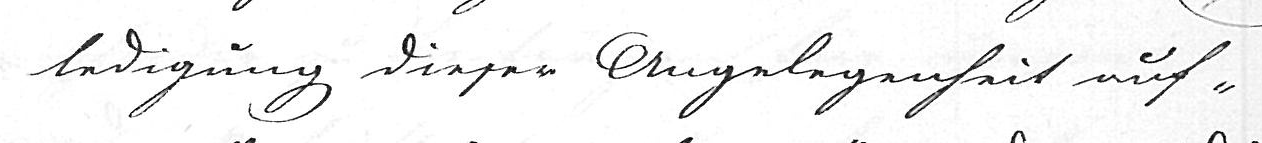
ledigung dieser Angelegenheit auf-
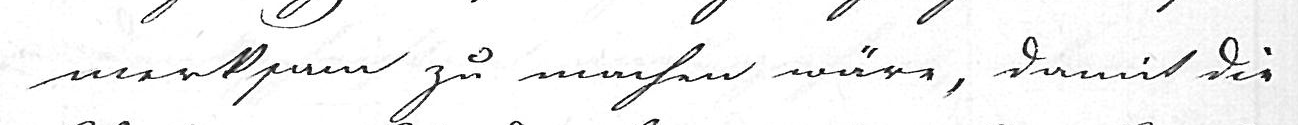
merksam zu machen wäre, damit die
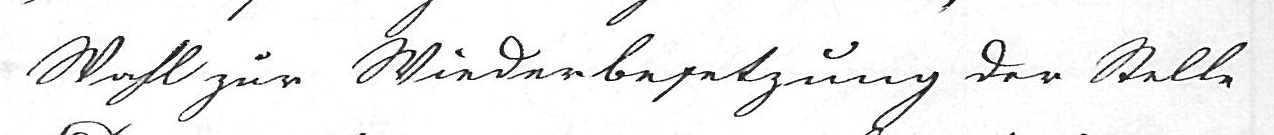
Wahl zur Wiederbesetzung der Stelle
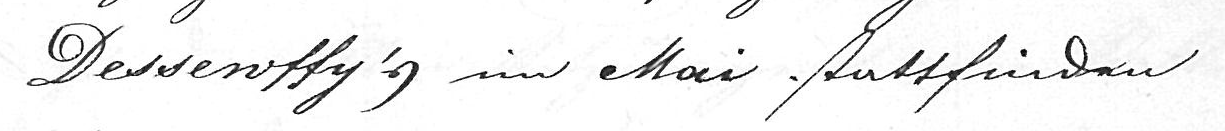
Dessewffys in Mai stattfinden
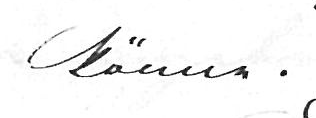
könne.
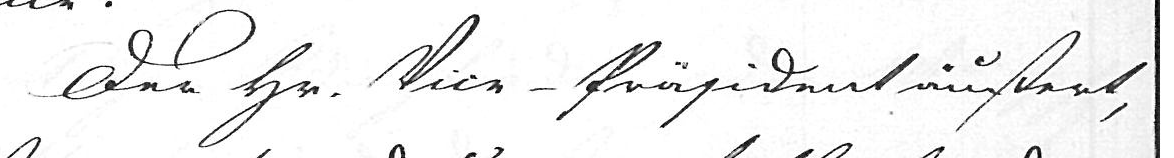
Der Hr. Vice-Präsident äußert,
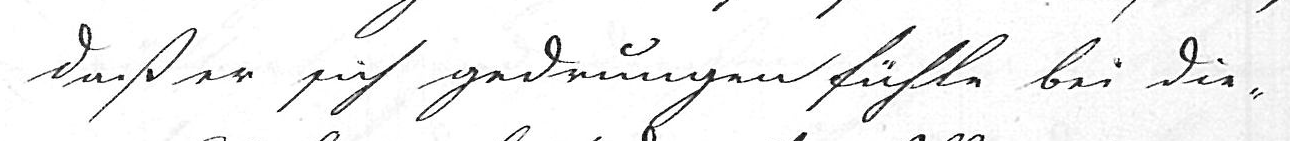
daß er sich gedrungen fühle bei die-
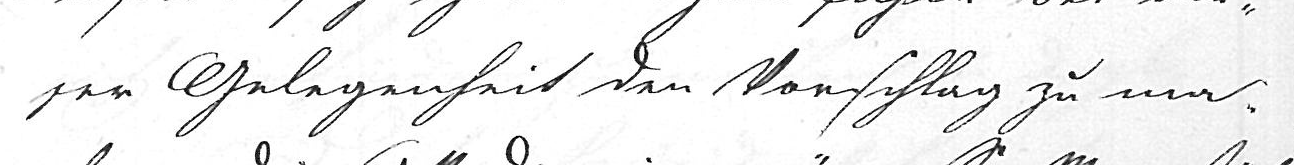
ser Gelegenheit den Vorschlag zu ma-
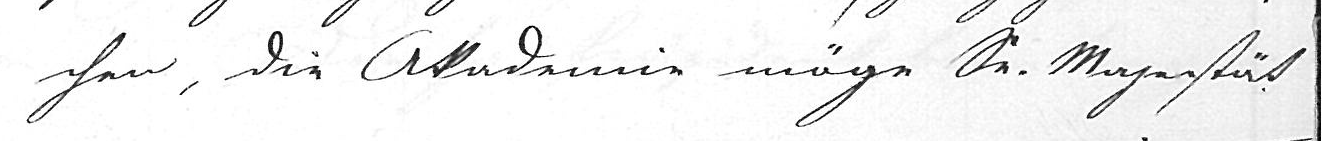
chen, die Akademie möge Se. Majestät
